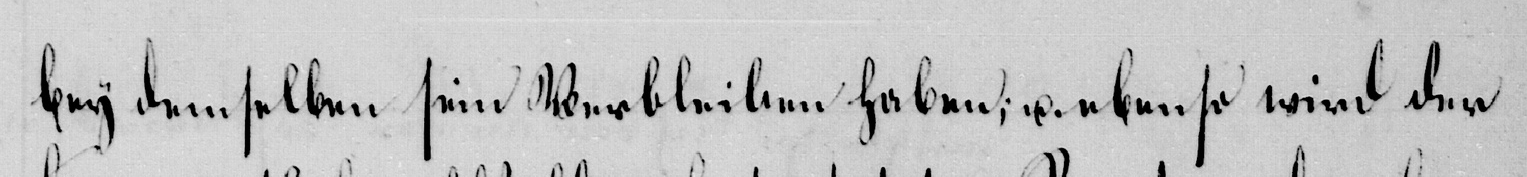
bey demselben sein Verbleiben haben; u. ebenso wird der
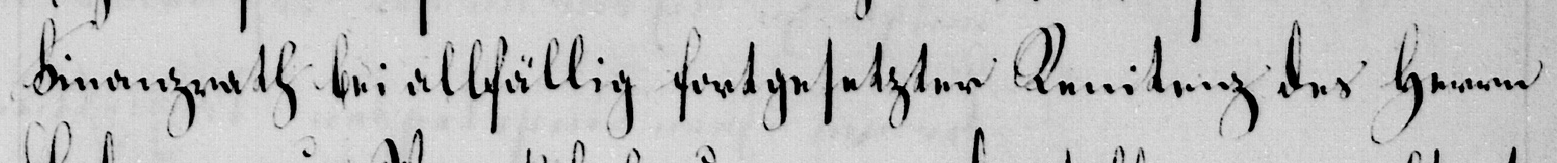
Finanzrath bei allfällig fortgesetzter Renitenz des Herrn
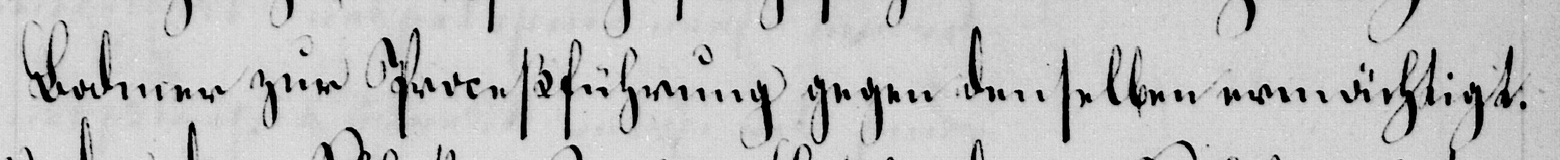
Bodmer zur Proceßführung gegen denselben ermächtigt.
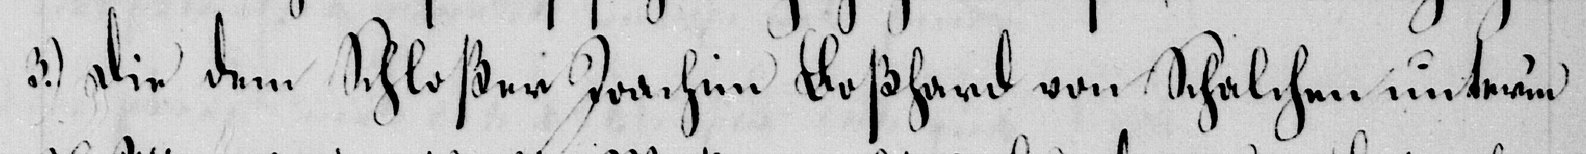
3.) Die dem Schloßer Joachim Boßhard von Schalchen unterm
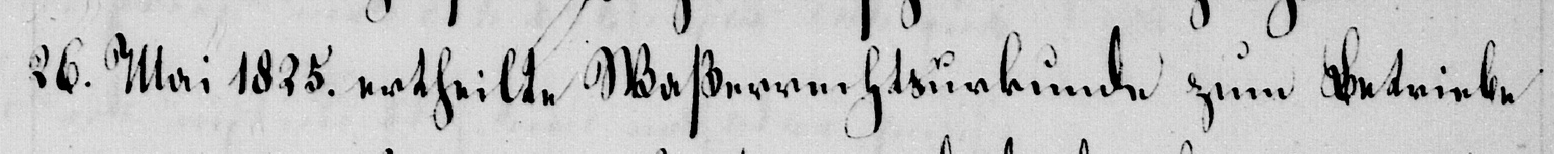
26. Mai 1825. ertheilte Waßerrechtsurkunde zum Betriebe
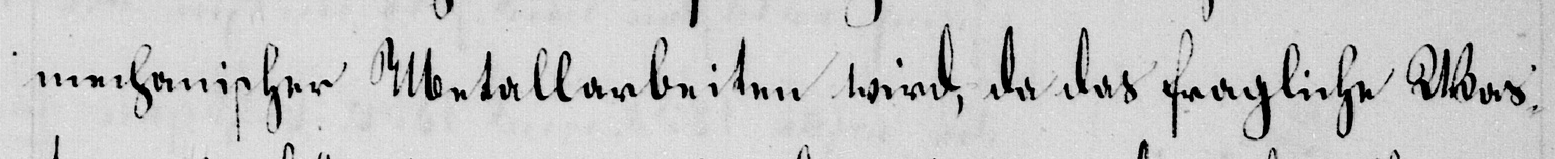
mechanischer Metallarbeiten wird, da das fragliche Wa¬
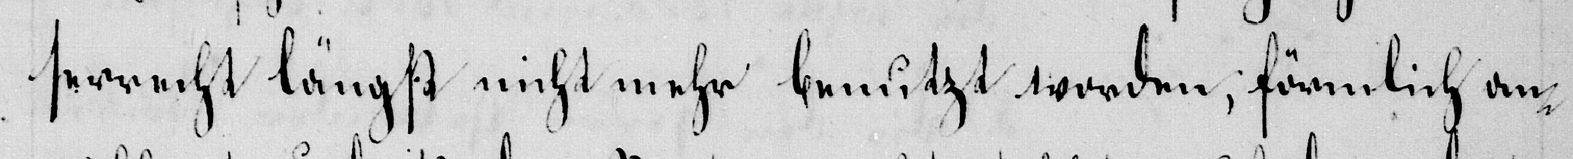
ßerrecht längst nicht mehr benutzt worden, förmlich an¬
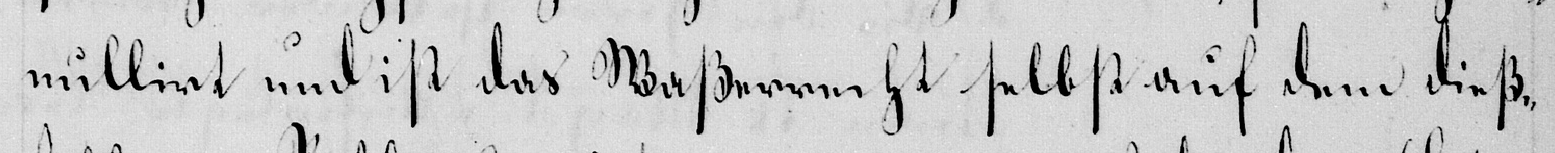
nullirt und ist das Waßerrecht selbst auf dem dieß¬
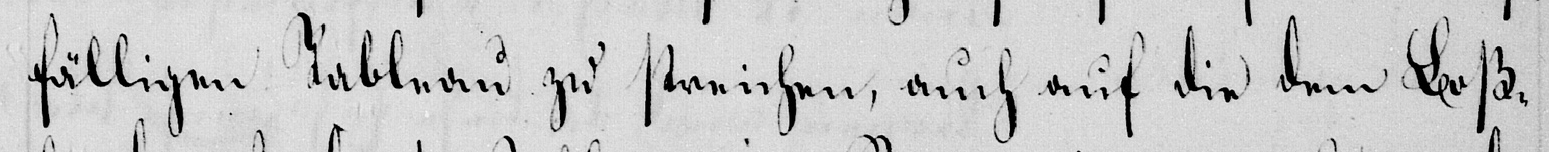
fälligen Tableau zu streichen, auch auf die dem Boß¬
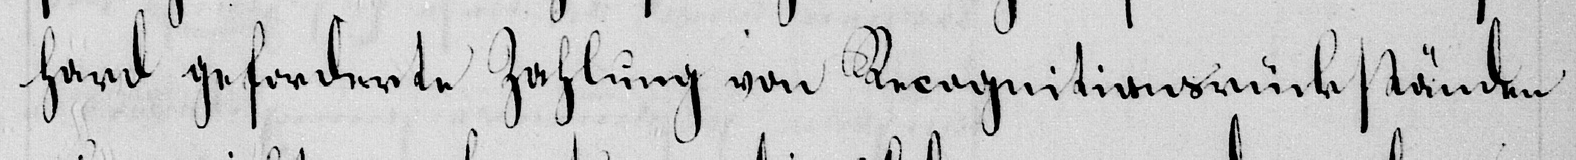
hard geforderte Zahlung von Recognitionsrückständen
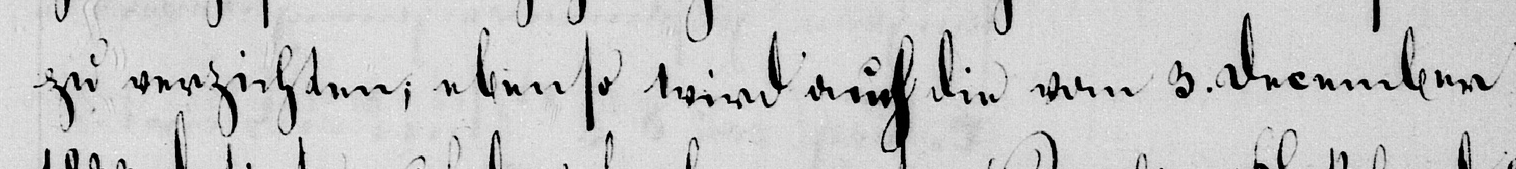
zu verzichten, ebenso wird auch die vom 3. December
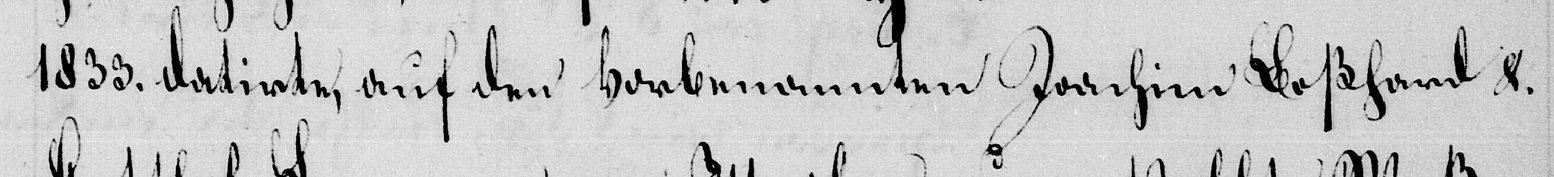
1833. datirte, auf den vorbenannten Joachim Boßhard &.
